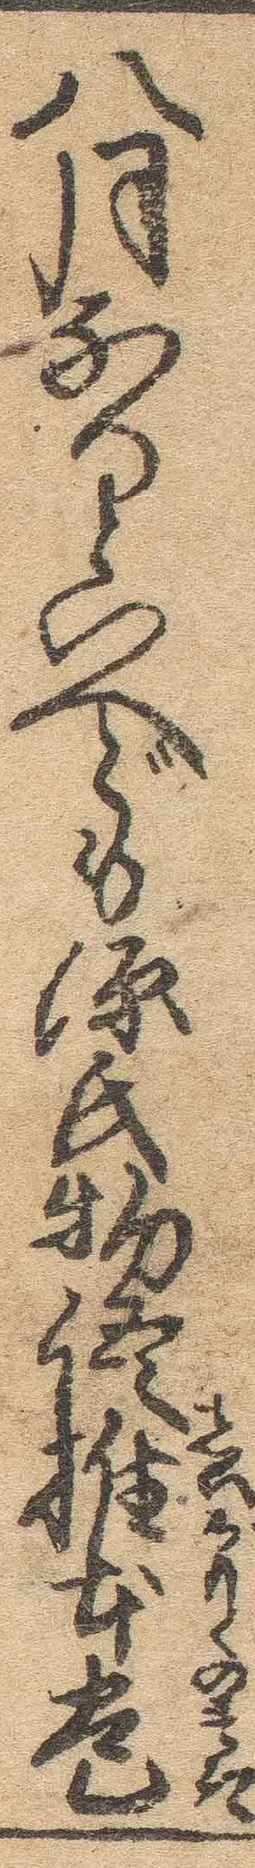八月なりといへども源氏物語椎本巻
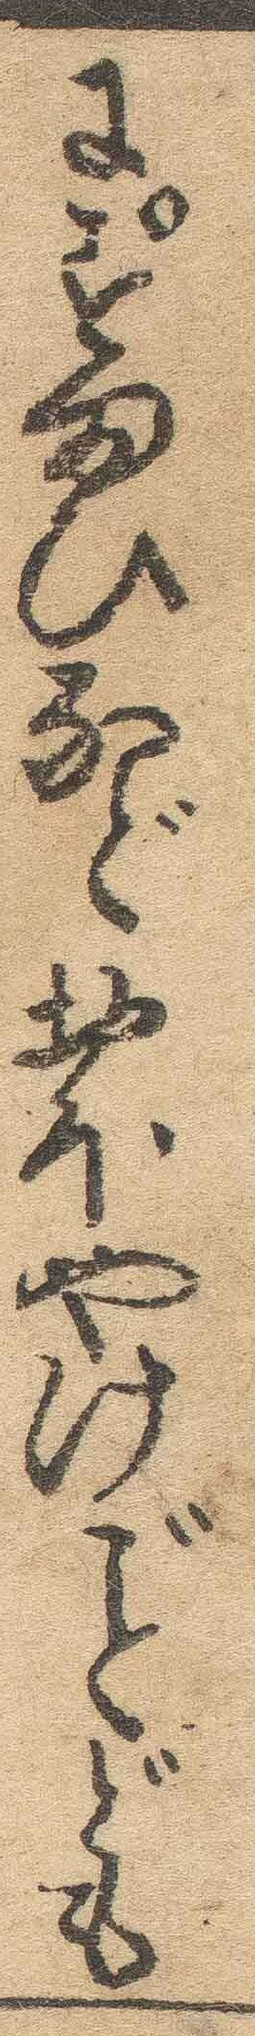に。すまひなどおほやけごとども
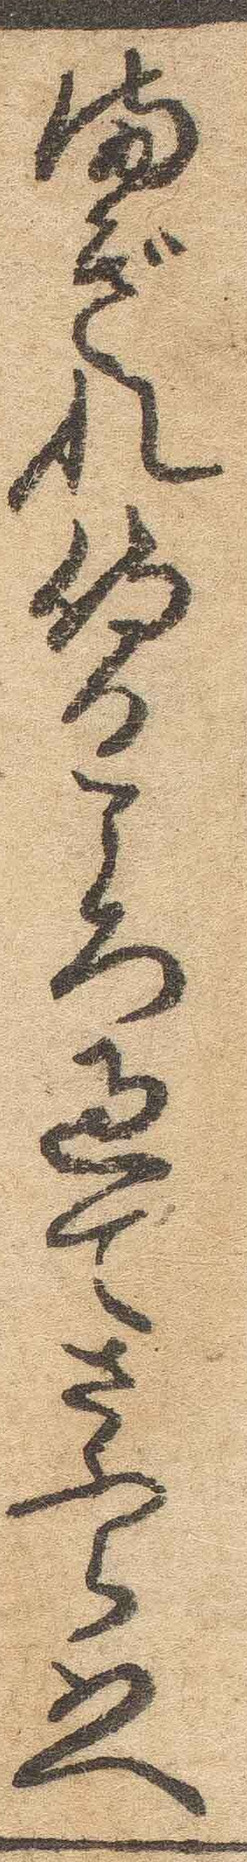まぎれ侍るころ過てさふらはへ
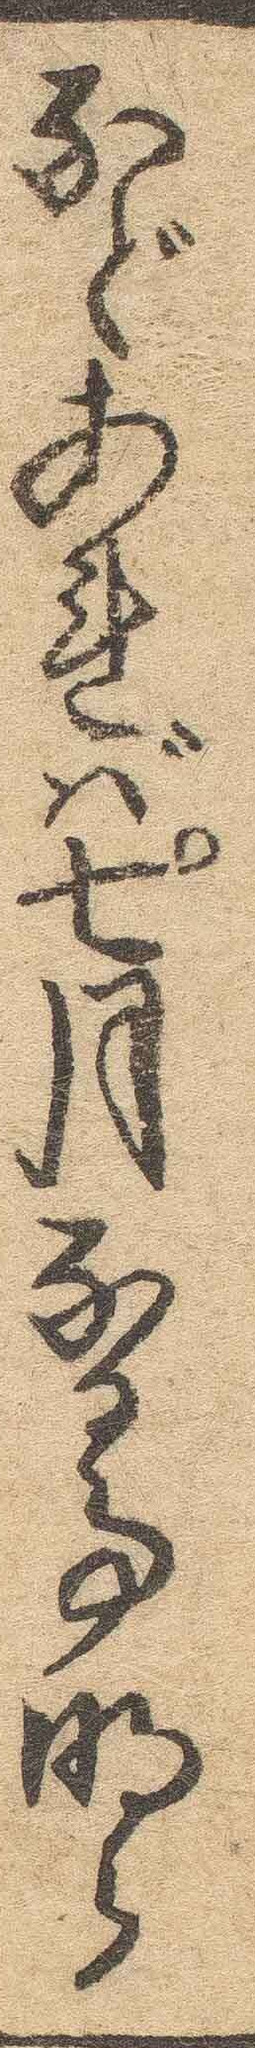などあれば。七月なる事明ら
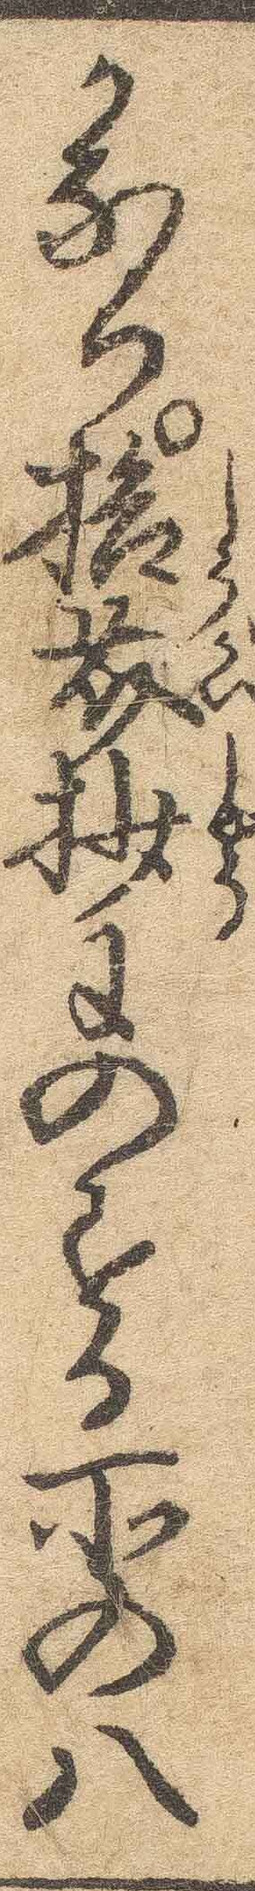かなり。拾芥抄にのする所の八
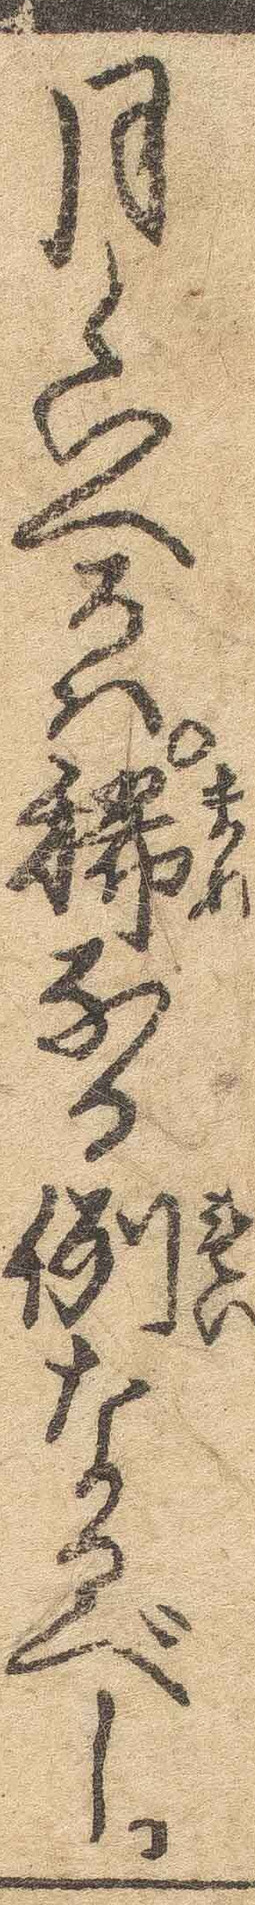月といへるは。希なる例なるべし。
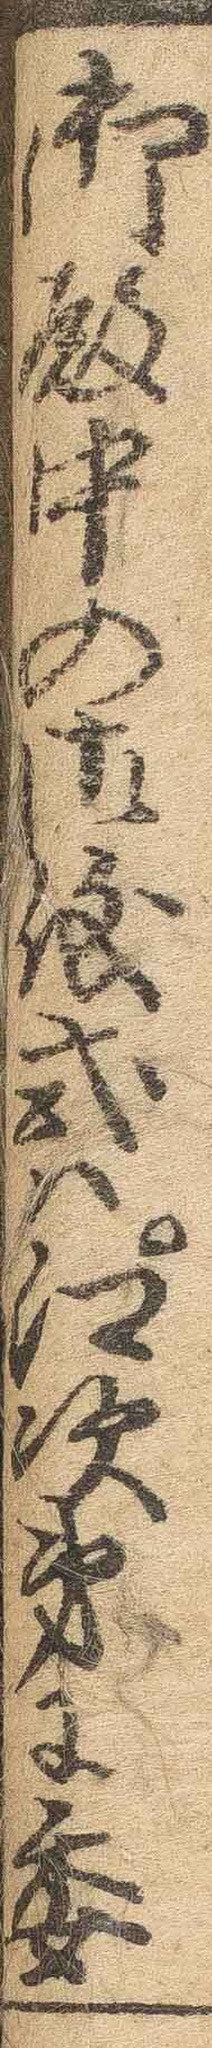御殿中の御儀式は。江次第に委
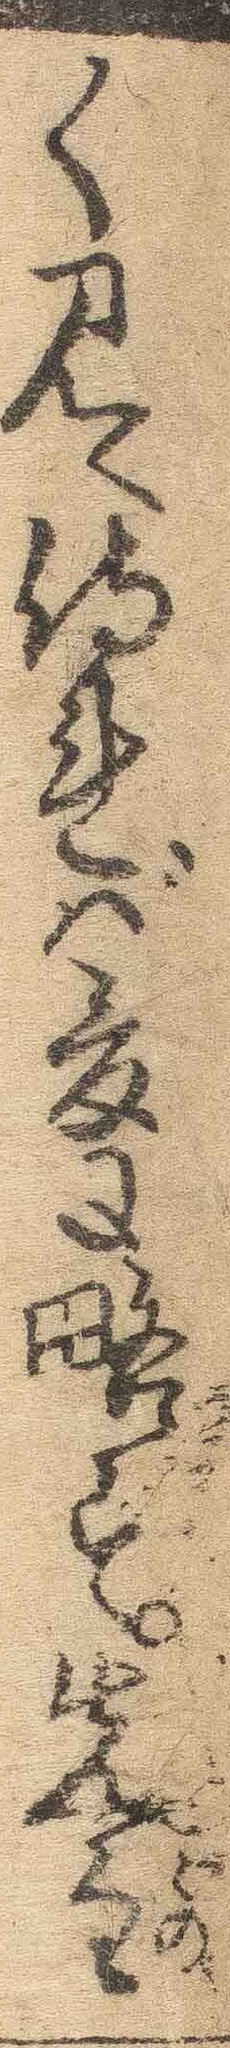く見へ侍れば爰に略す。先主
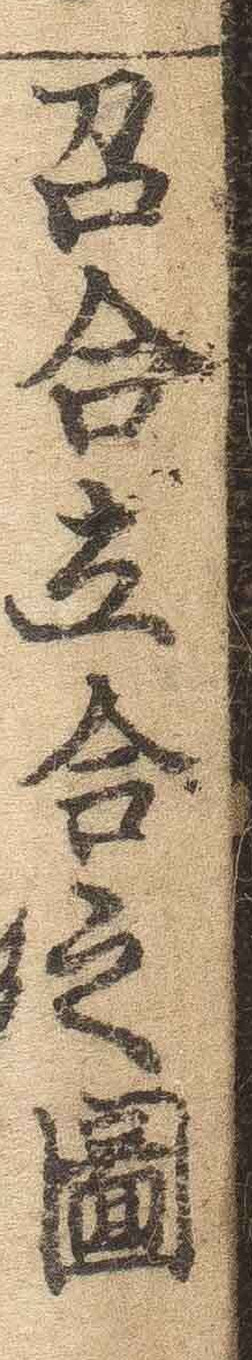召合立合の図
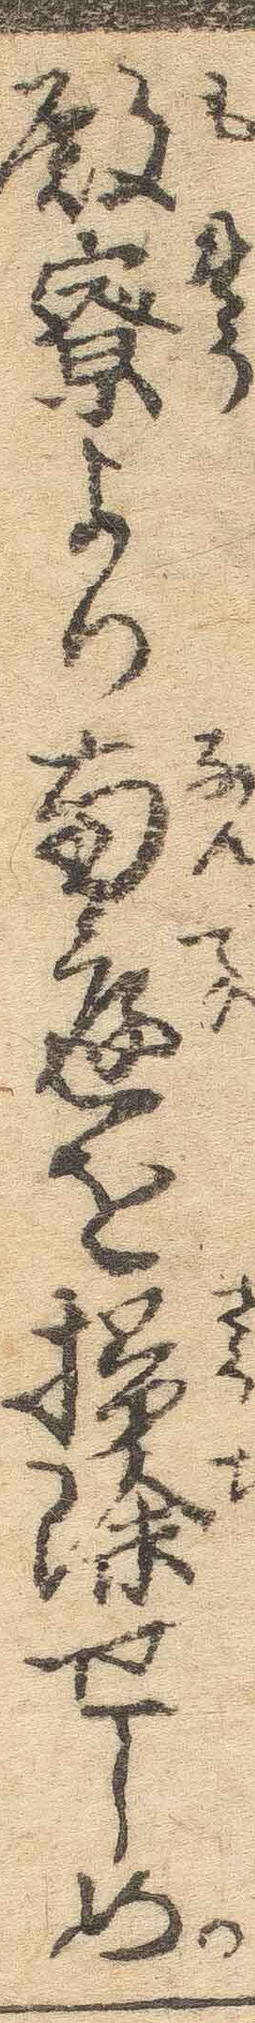殿寮より南庭を掃除せしめ。
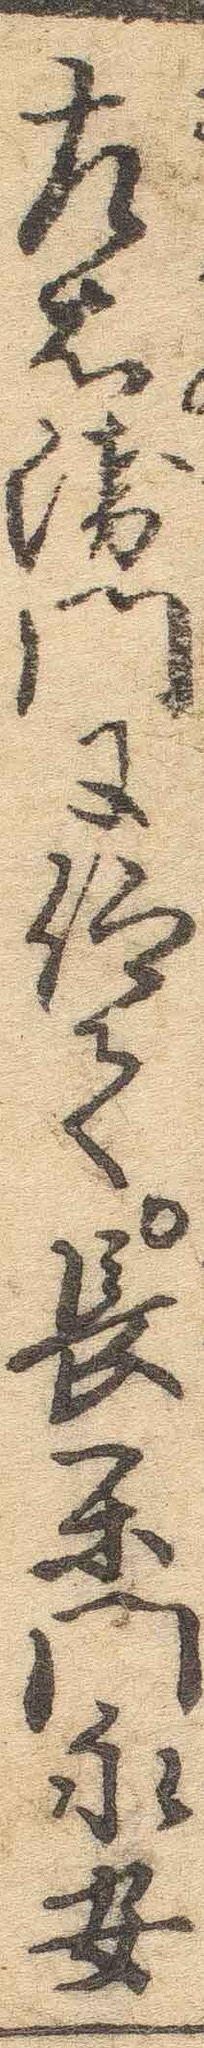左右衛門に仰て。長楽門永安
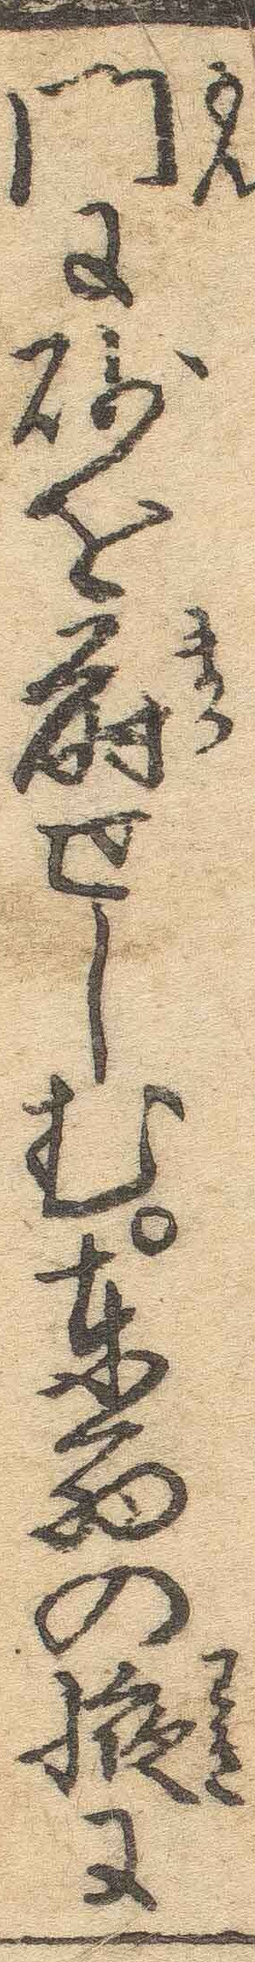門に砂を蒔せしむ。東西の腋に
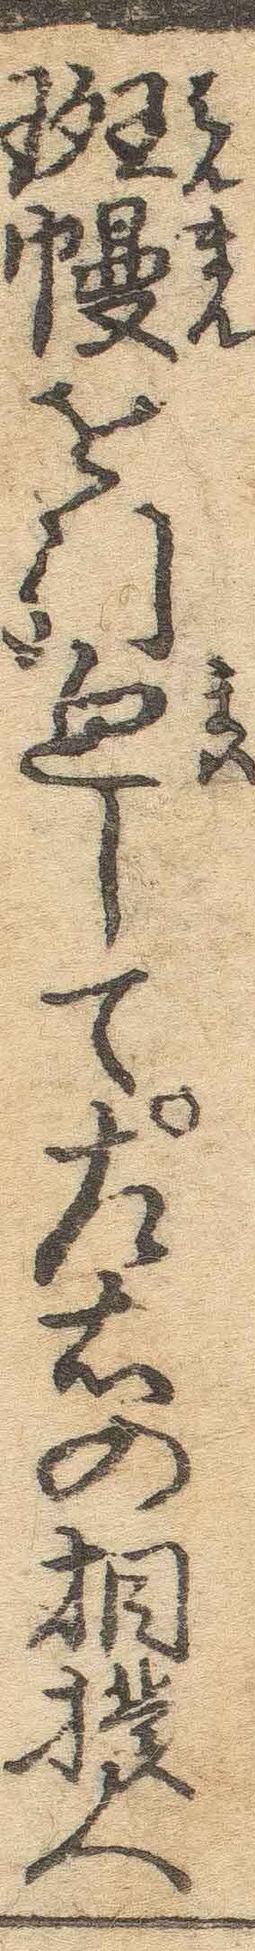斑慢を引廻して。左右の相撲人
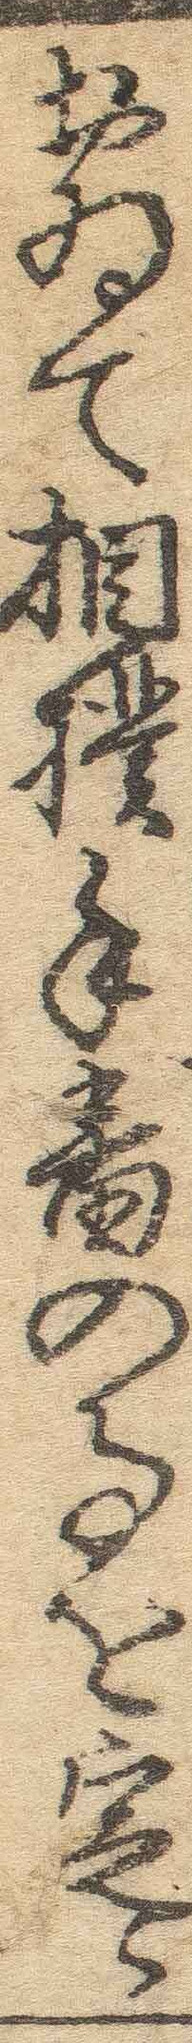おゐて相撲手番の事を定ら
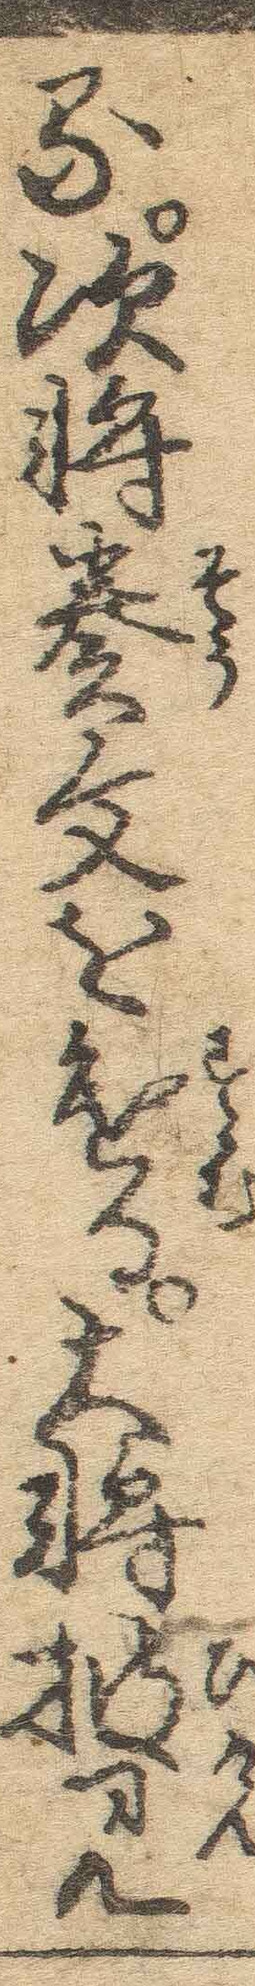る。次将奏文を進る。大将披見
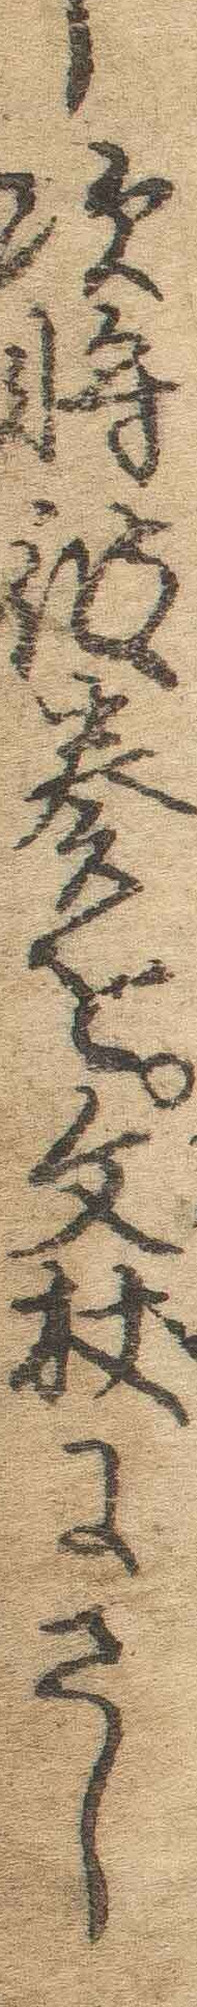し次将彼奏を。文杖にさし
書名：古今相撲大全
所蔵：東京学芸大学附属図書館 国文学研究資料館
